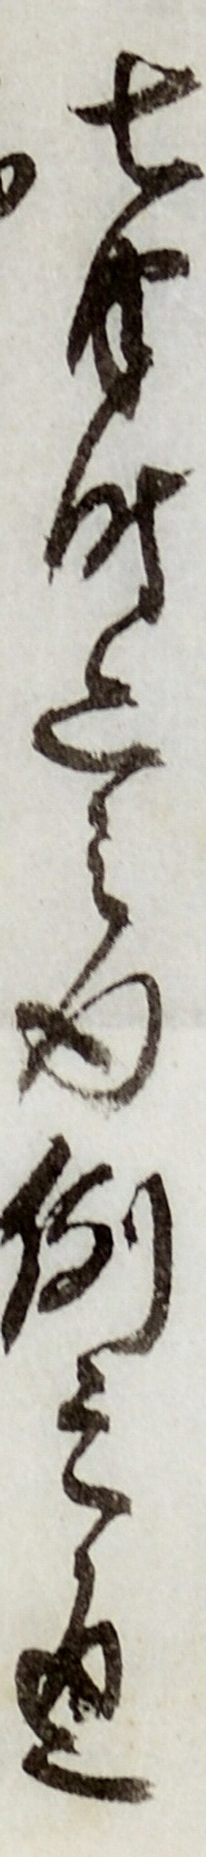七半時迄之内例之通
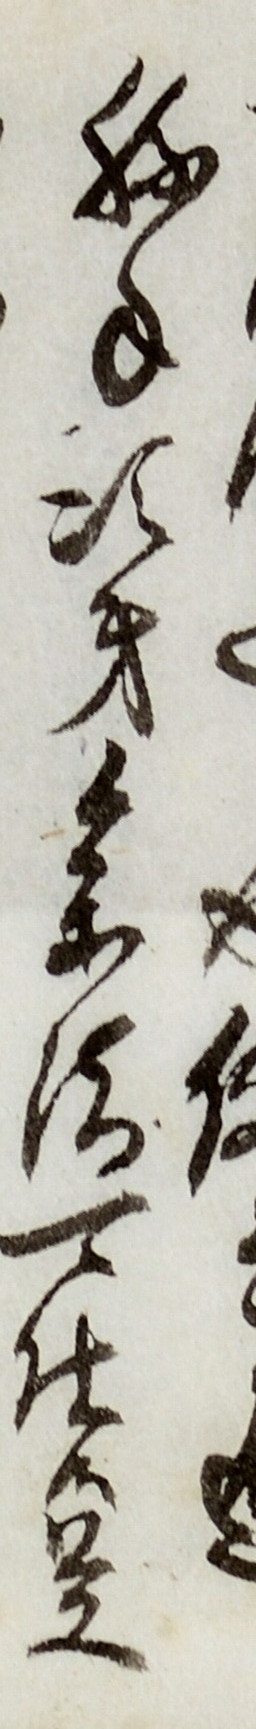勝手次第参詣可仕候且又
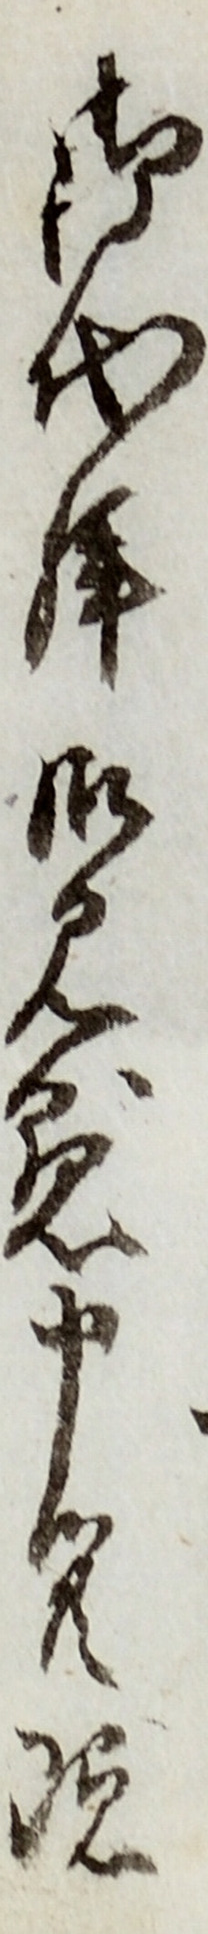御代拝御見懸申候共隠
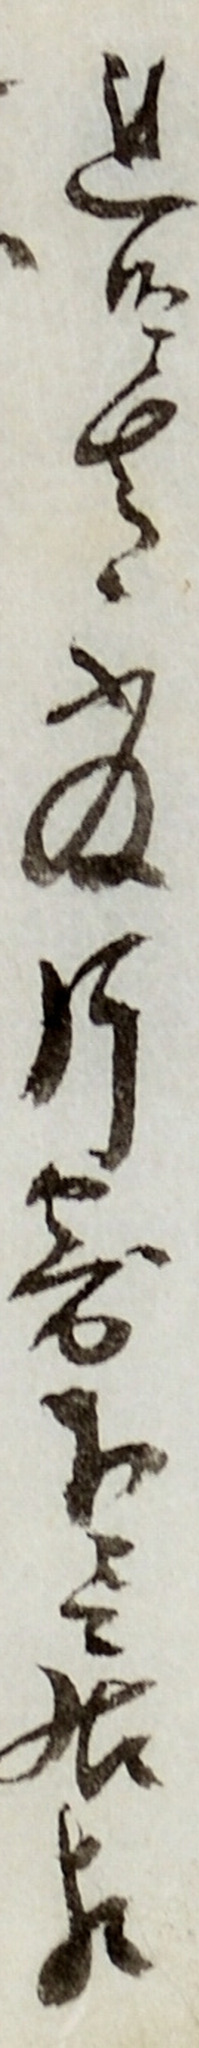れ候には不及片寄下に居相
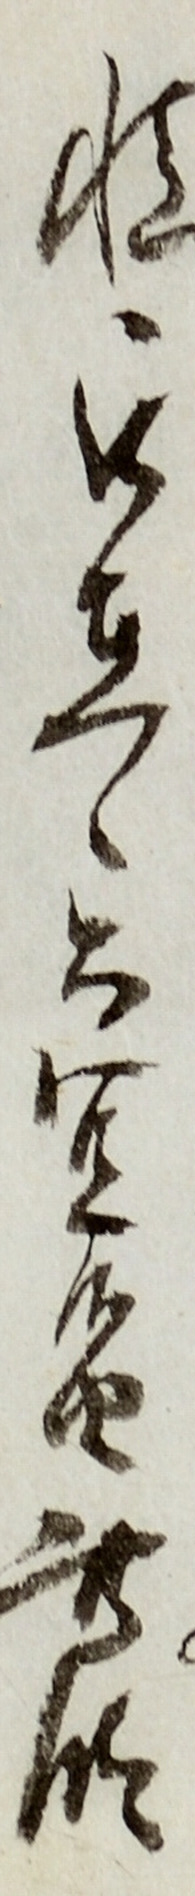慎罷在候て宜候由此段
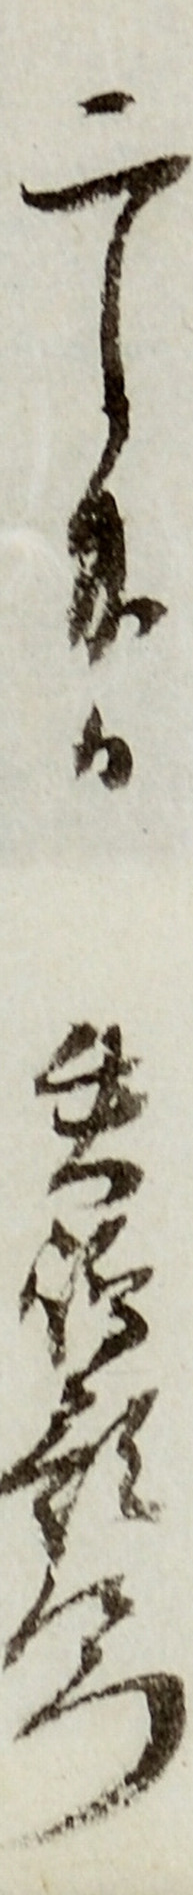二月廿日矢島郡左衛門
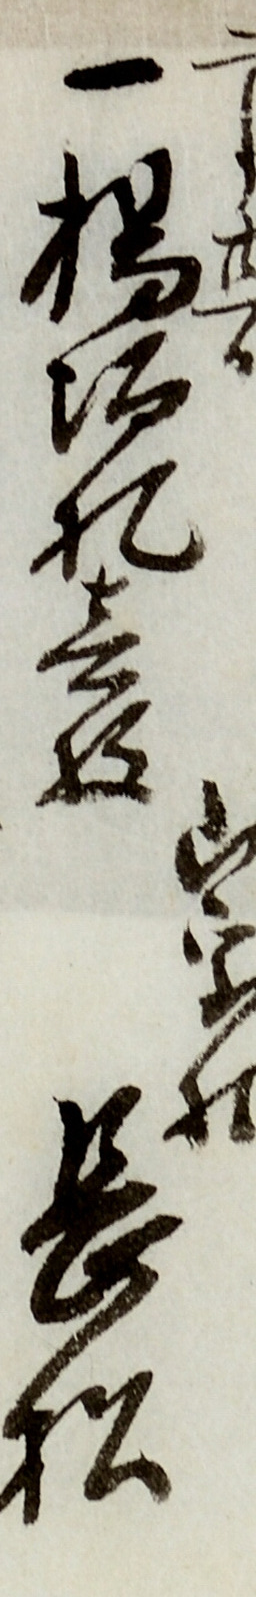一揚酒札壱枚長松
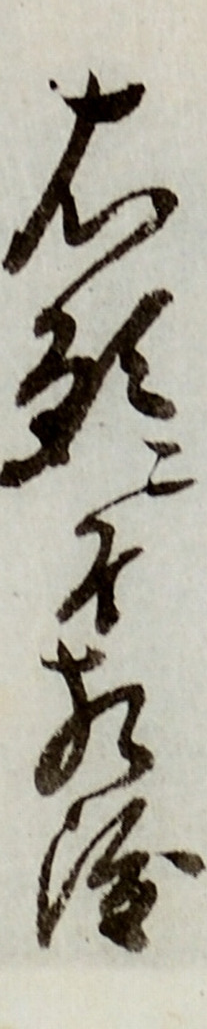右願に付相渡
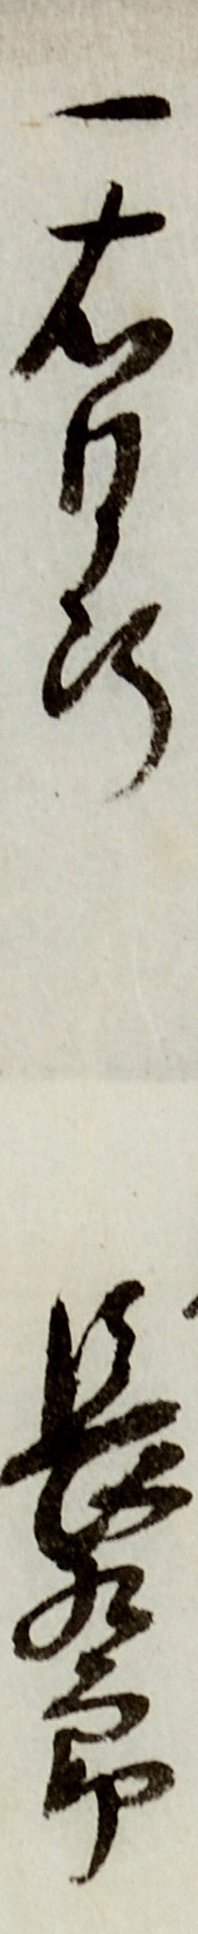一右同断長九郎
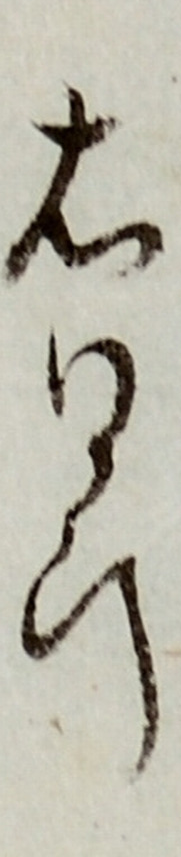右同断
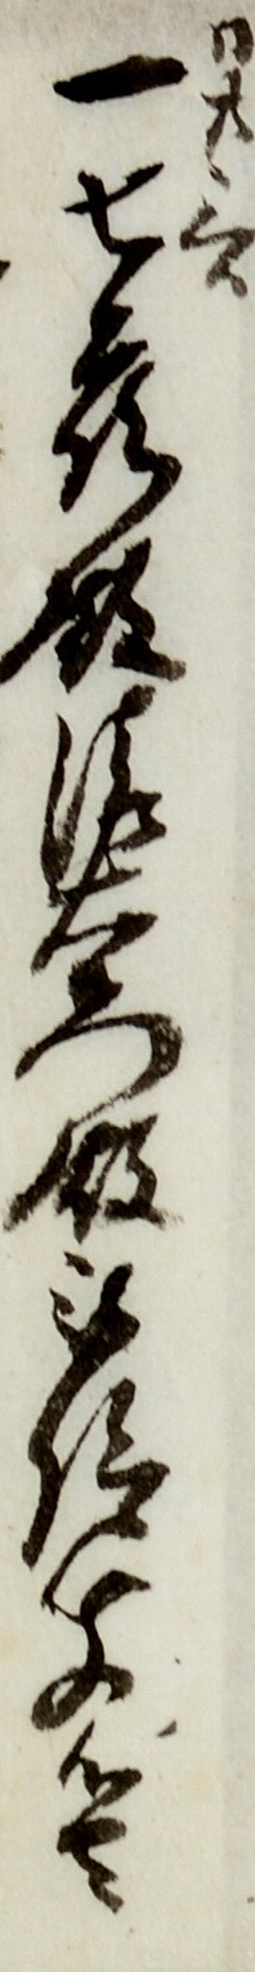一七蔵殿清右衛門殿被仰聞候は
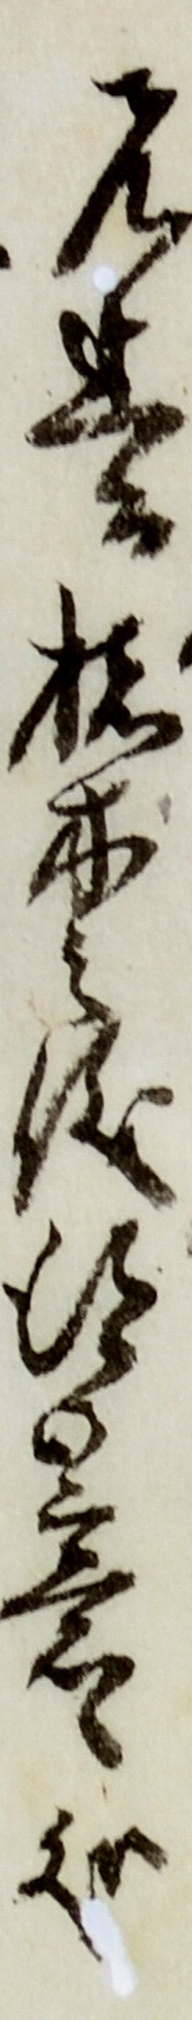先達而楮木之儀得其意候処
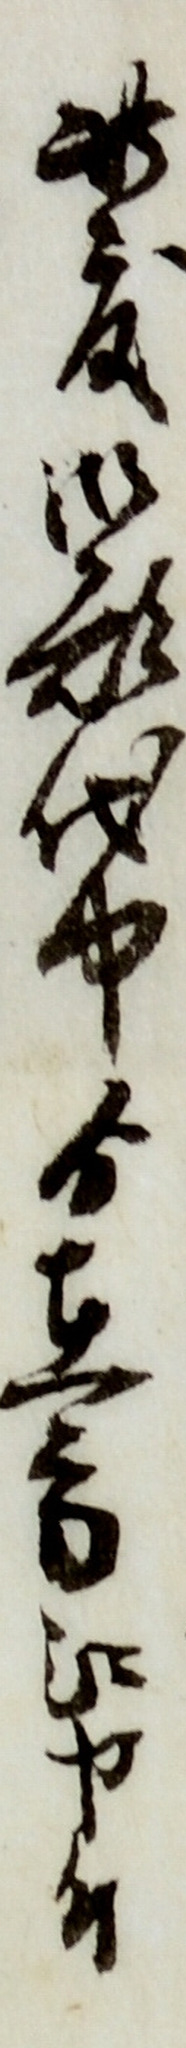此度御郡代中より在方え申付
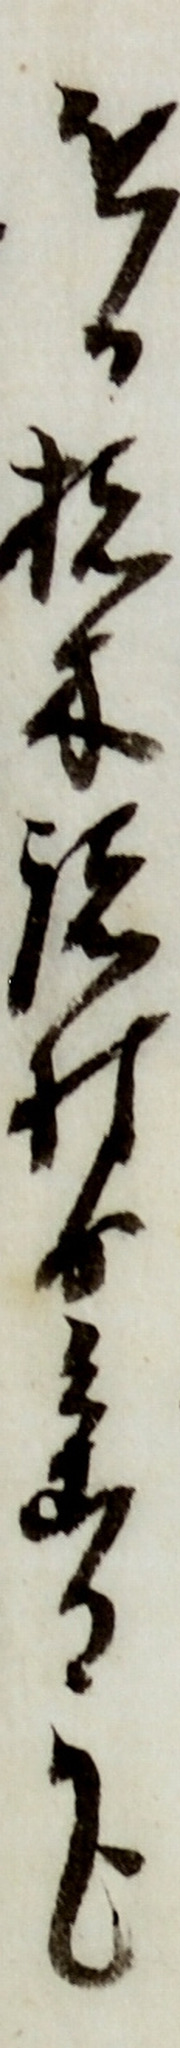近日楮木諸村より参り可申候
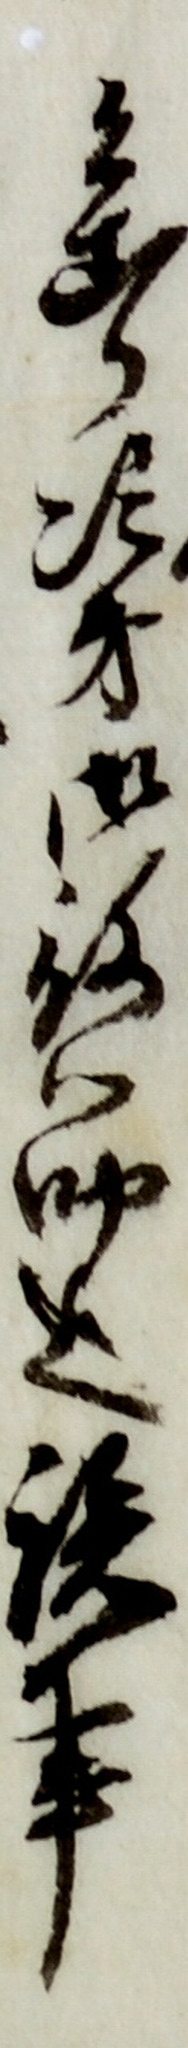参り次第御役筋迄談事

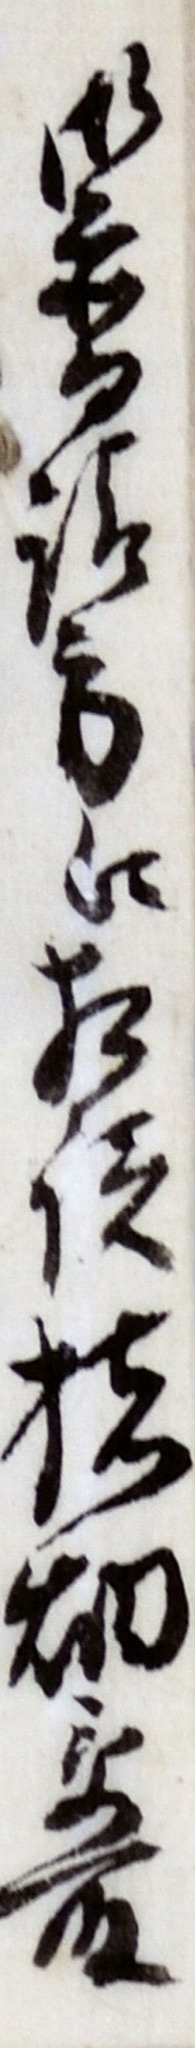御普請方え相談楮畑受取
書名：諸事御用留帳
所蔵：伊那市立高遠町図書館・合同会社AMANE
